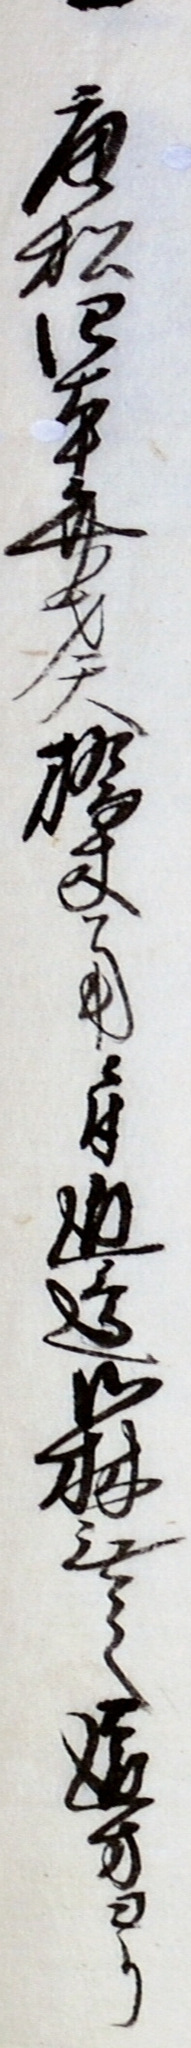一唐松四本弁才天橋木御用ニ付近辺御林無之遠方ヨリ
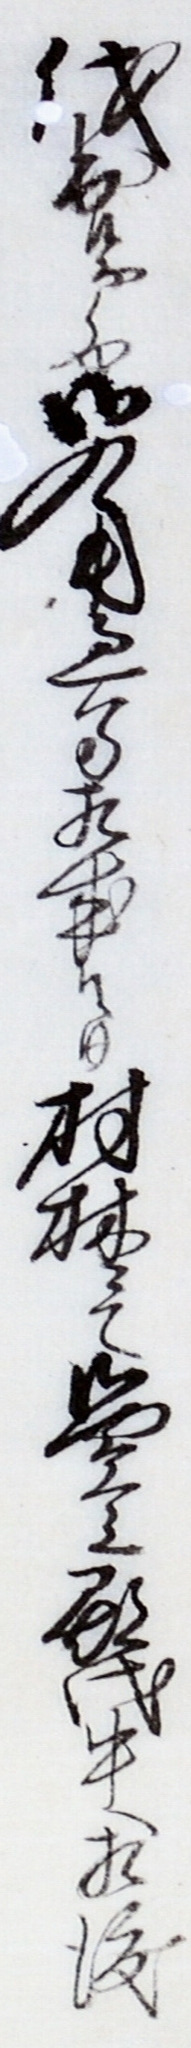伐出候御入用過分相成候ニ付村林ニて御買上郡代中へ相渡
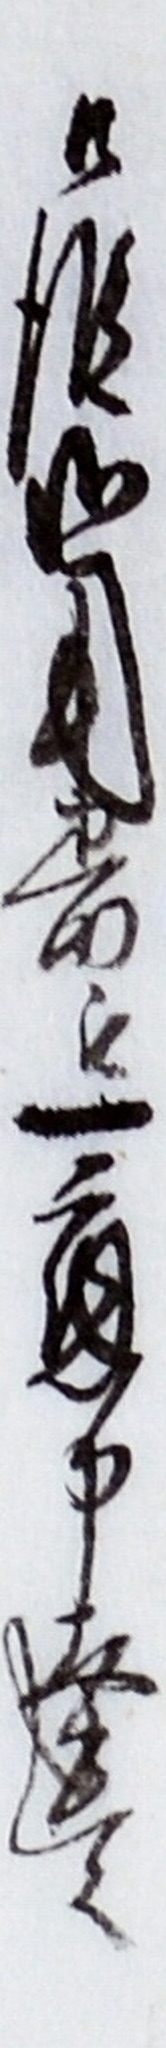候段御用番江一応申達ス
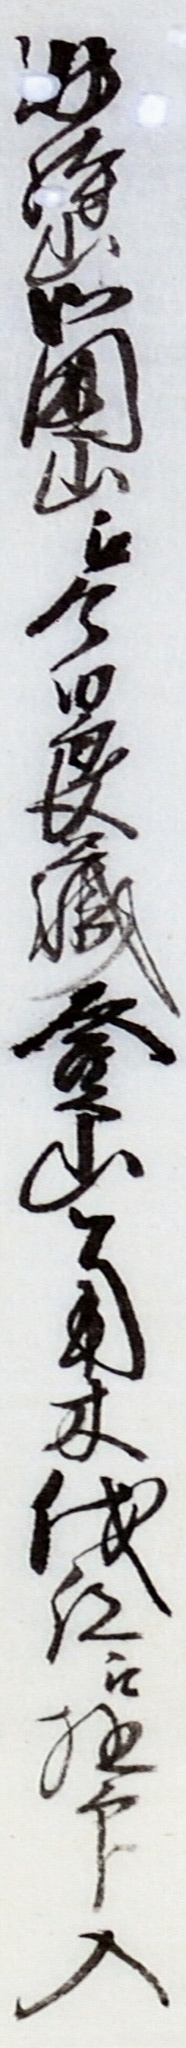一非持山御囲山江今日良蔵登山御用木伐跡江極印入
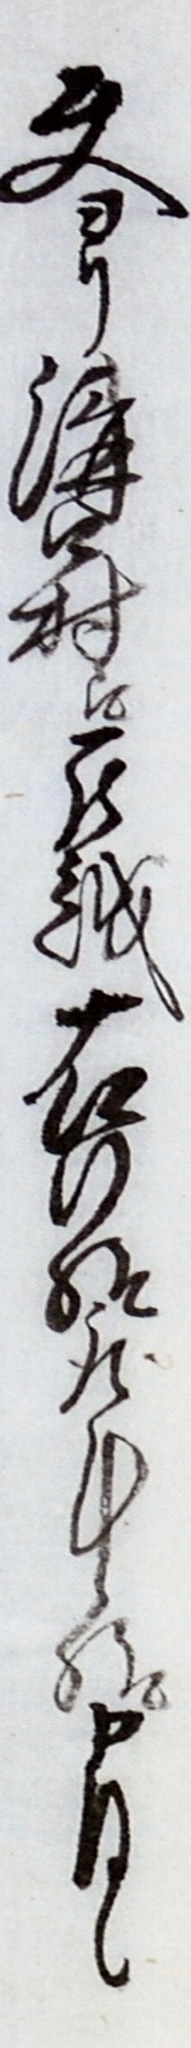夫ヨリ溝口村江罷越右同様取計候様申付候
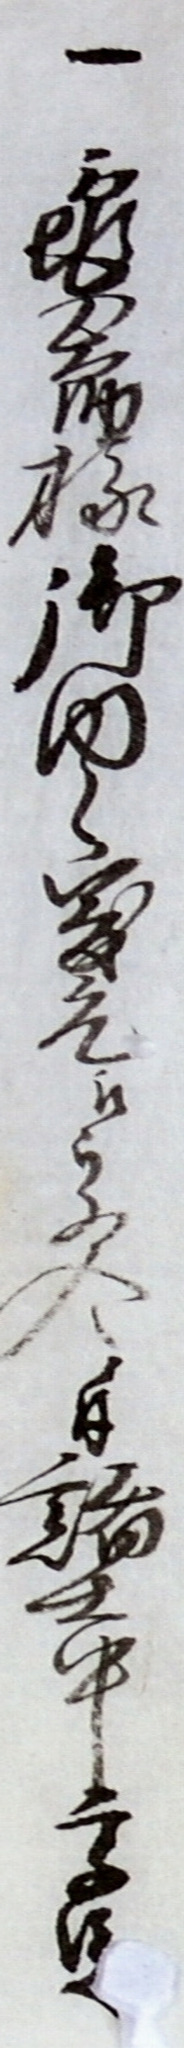一亀太郎様御内々爰元江被為入候ニ付諸士中高足
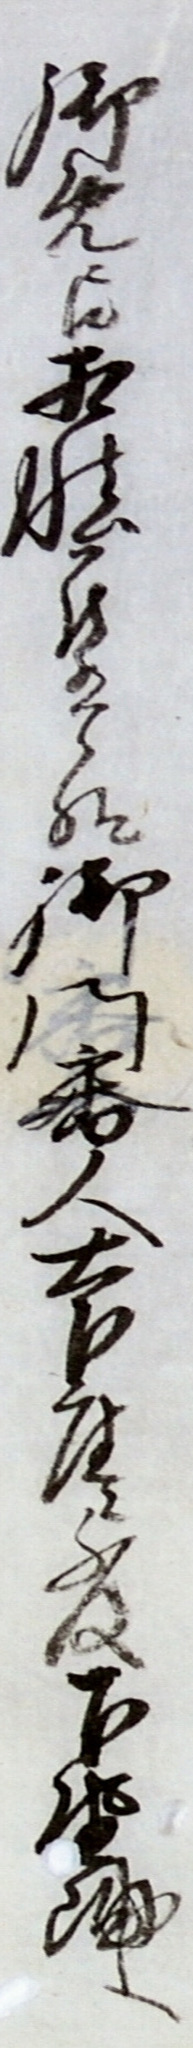御免ニ候相慎罷有候様御門番人土下座ニ不及下坐鋪へ
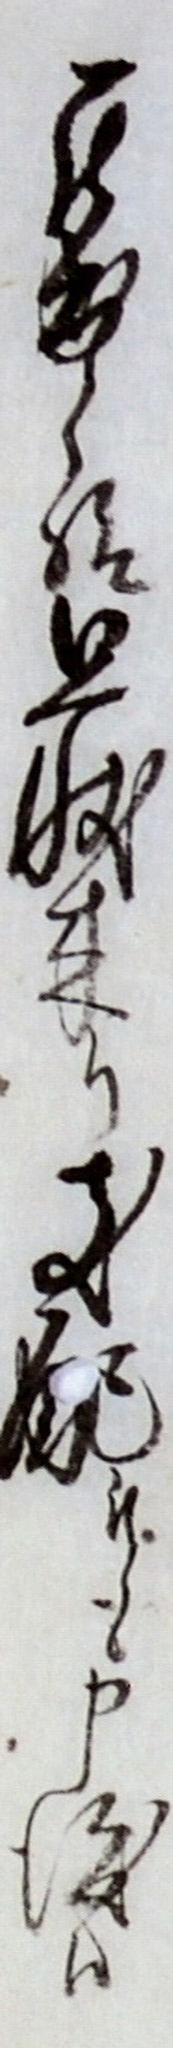罷出候様廻状来り支配江も申渡候

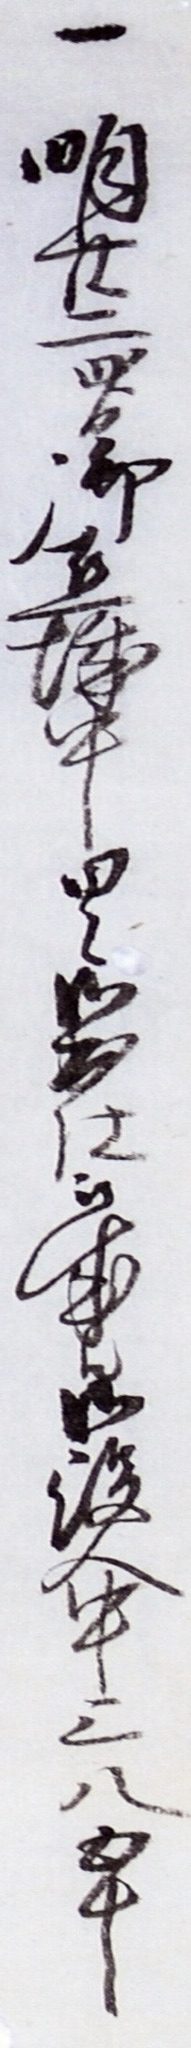一明廿二日ゟ御在城中日々御出仕被成候御役人中三八五斗
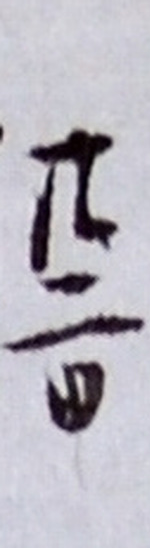廿二日
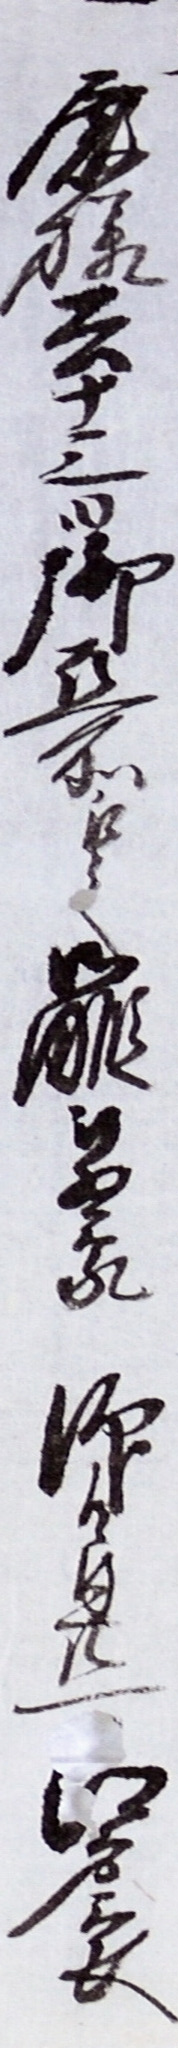一殿様去十三日御在所江之御暇被為蒙仰候ニ付廿一江戸表
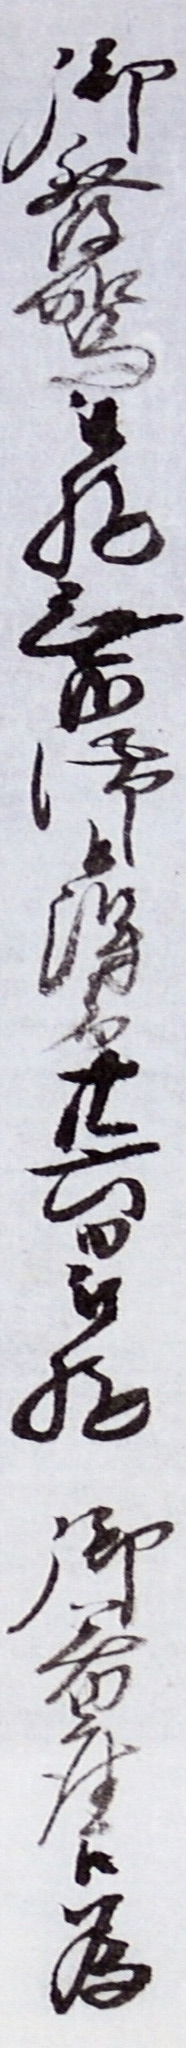御発駕被遊無御滞候得は廿六日被遊御着座候為
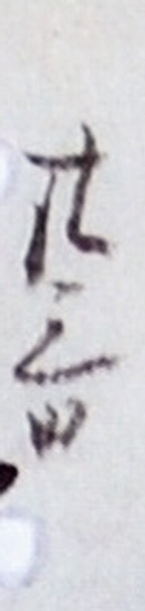廿三日
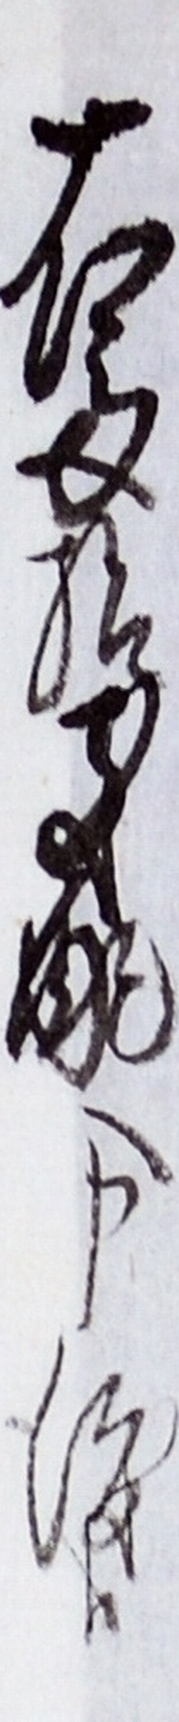右両様支配へ申渡候
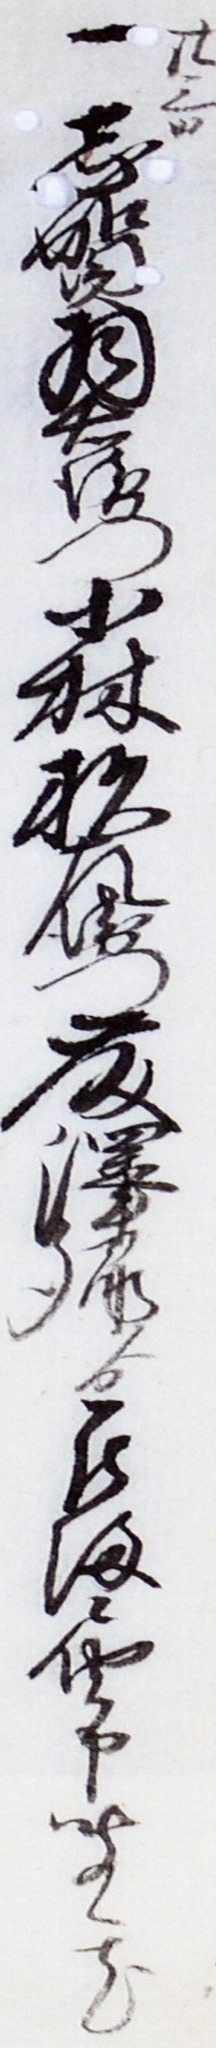一志賀羽右衛門小林杉左衛門藤沢郷ゟ罷帰届申聞候尤
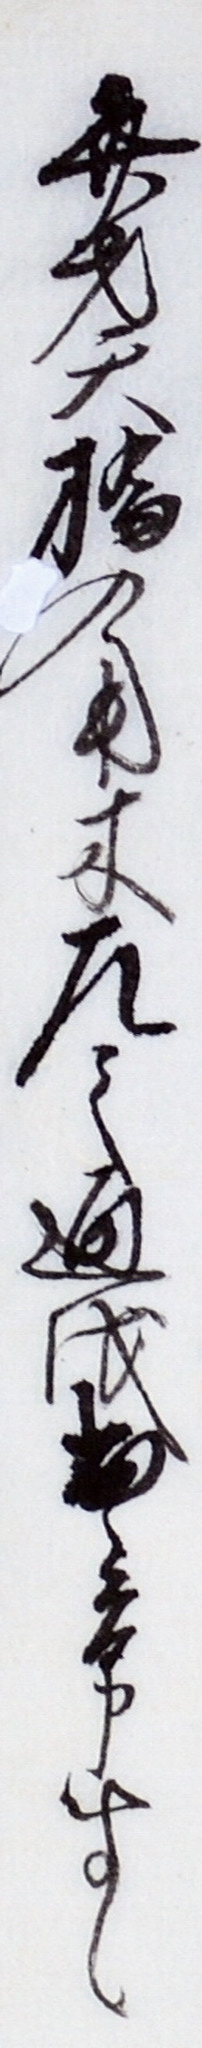弁才天橋入用木左之通伐出候旨申聞候
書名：御山奉行御用控
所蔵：伊那市立高遠町図書館・合同会社AMANE
